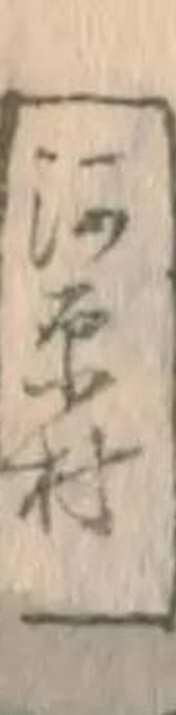河原村
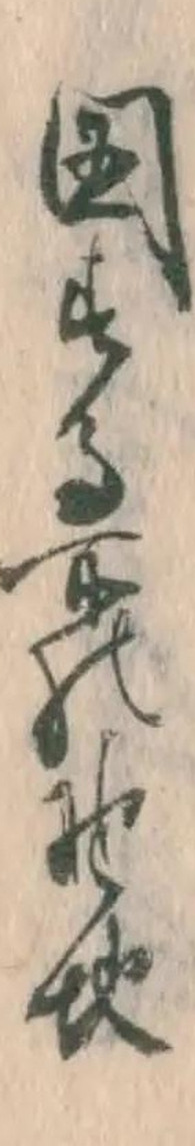図する所の野地
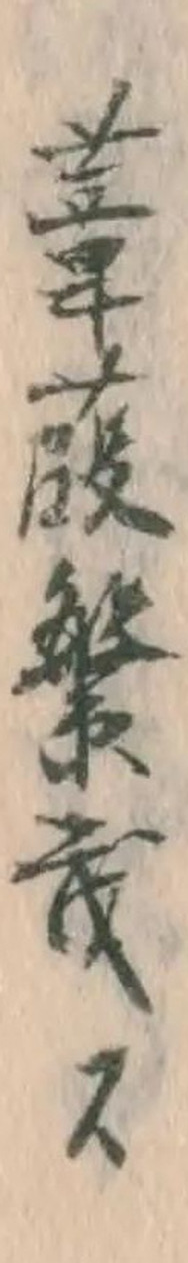葦葭繁茂ス
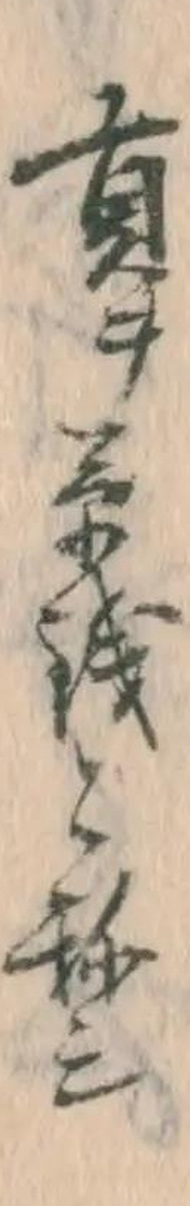貢ヲ草銭ト称シ
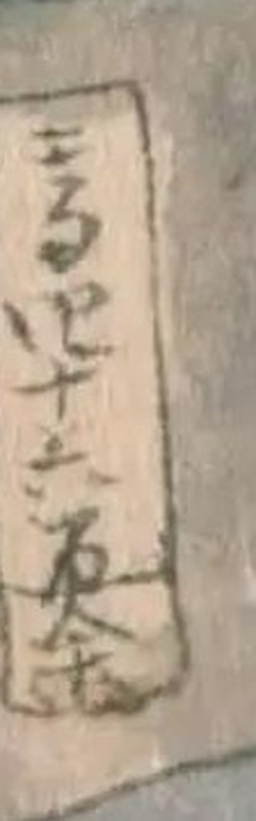高四十六石余
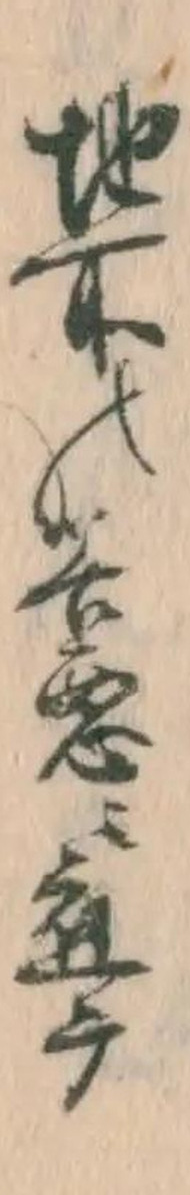地所の善悪ニ応テ
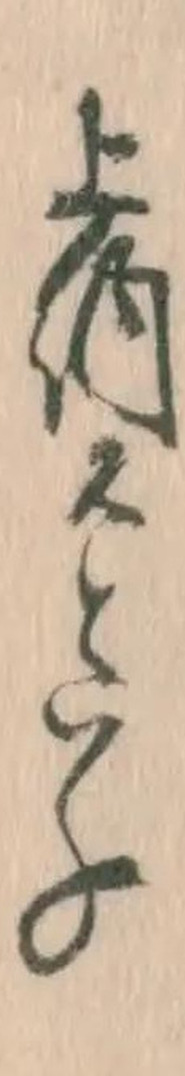上納スといふ
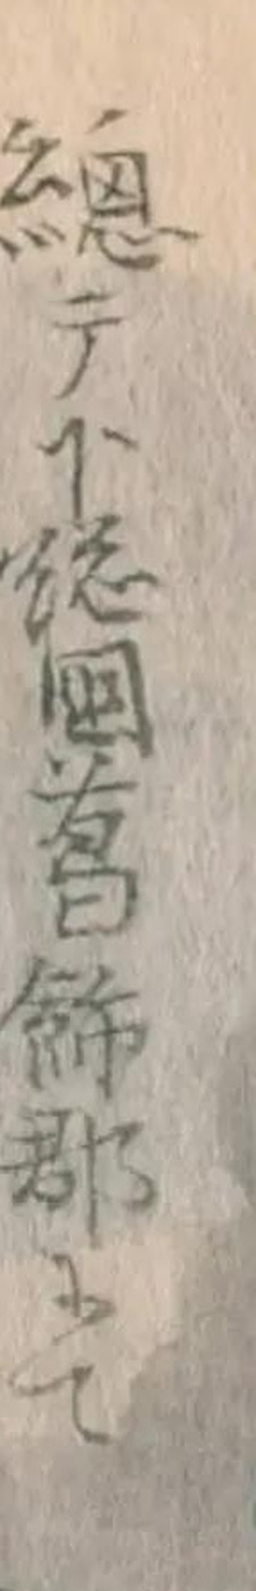総て下総国葛飾郡にて
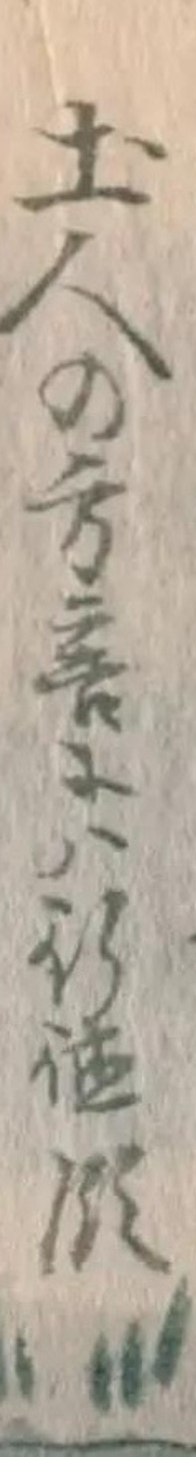土人の方言には行徳領
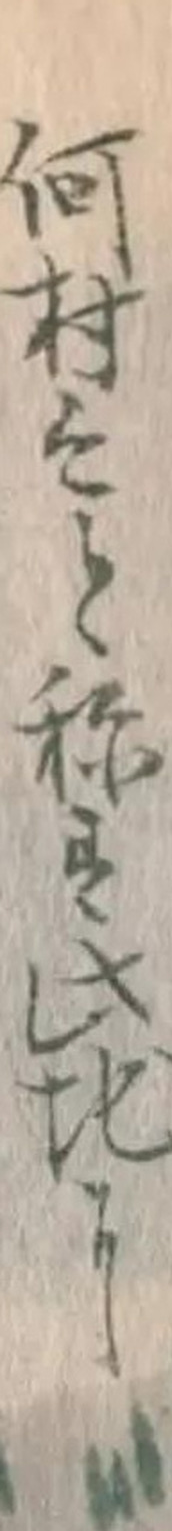何村そと称す此地に
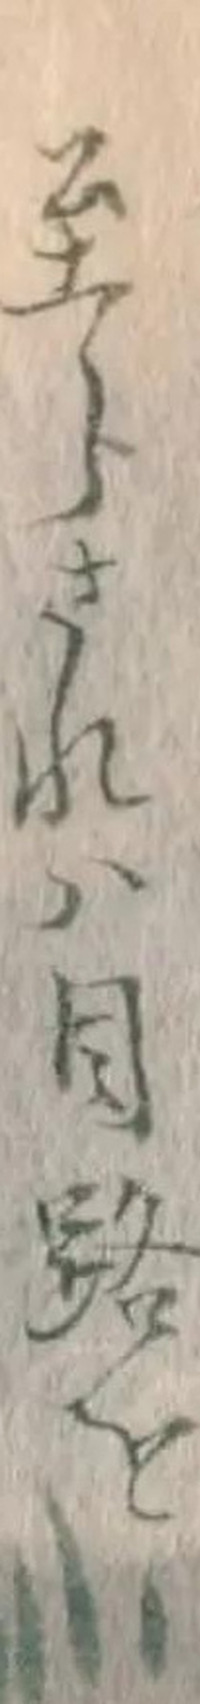至らされは目路を
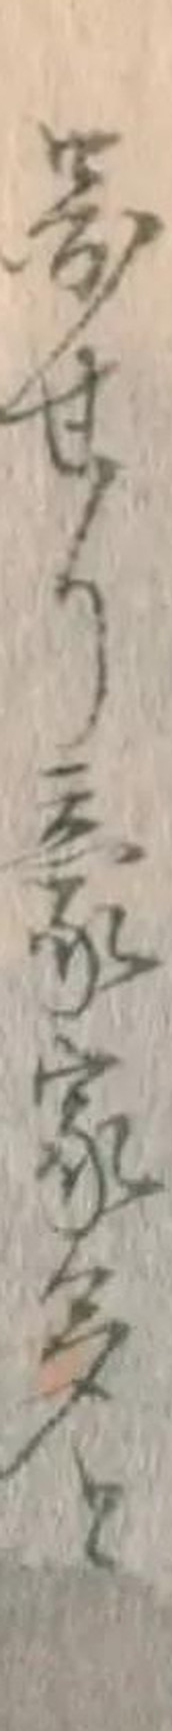図せり豪家多と

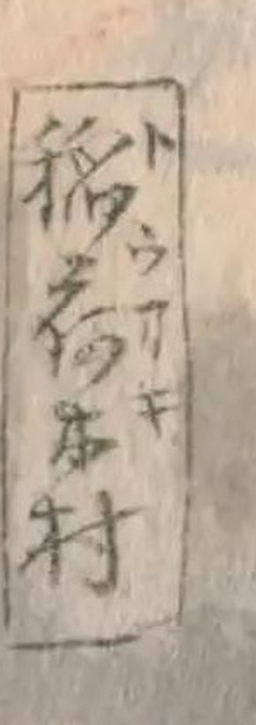稲荷木村
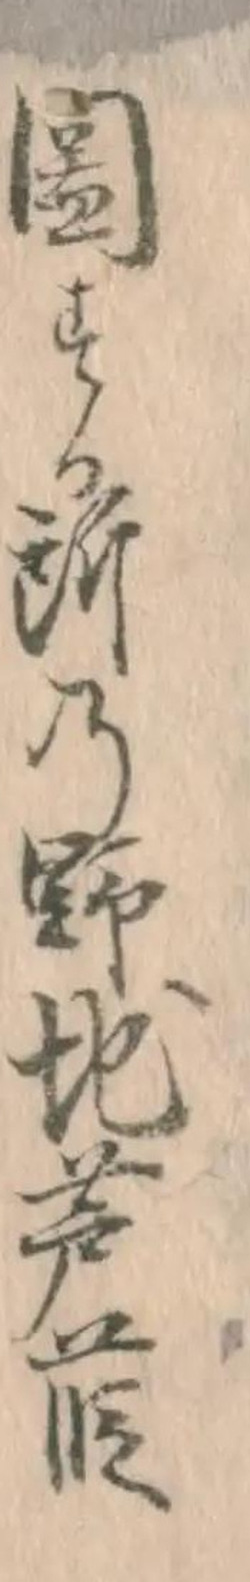図する所の野地芦葭
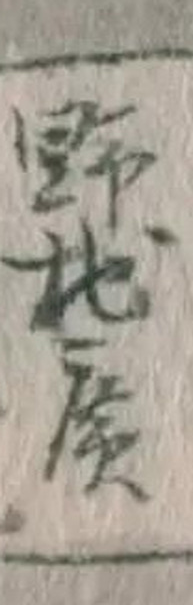野地広
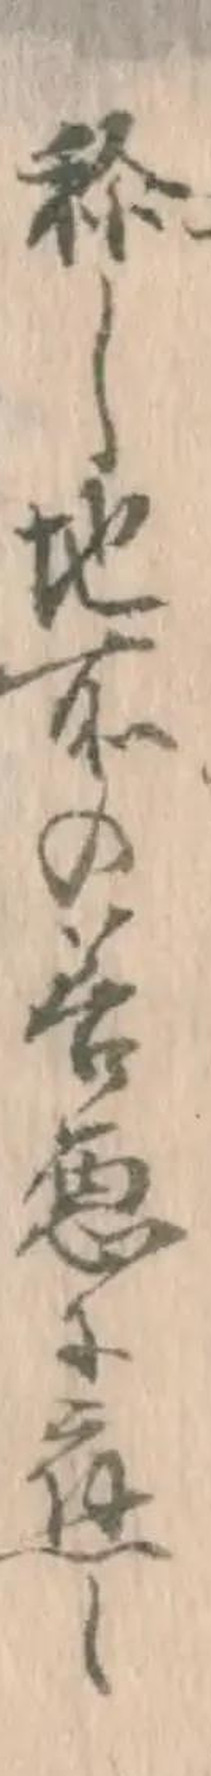称し地所の善悪に応し
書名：四神地名録 6巻. [4]葛飾郡
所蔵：国立国会図書館 National Diet Library, JAPAN
